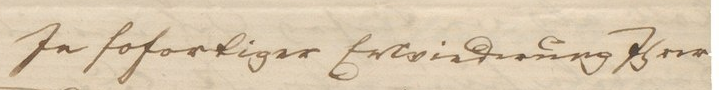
In sofortiger Erwiederung Ihrer
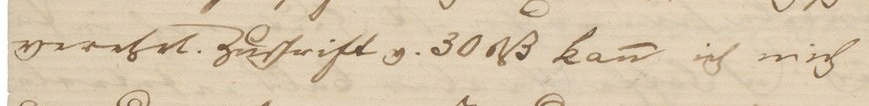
verehrl. Zuschrift v. 30dß kann ich mich
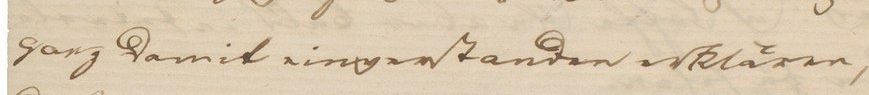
ganz damit einverstanden erklären,
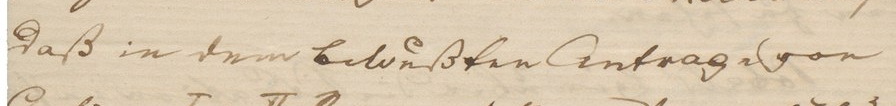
daß in dem bewußten Antrage von
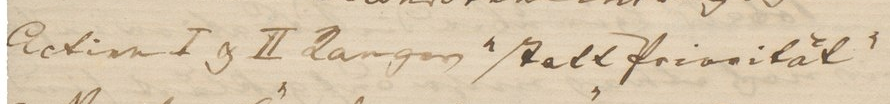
Actien I & II «Ranges» statt «Priorität»
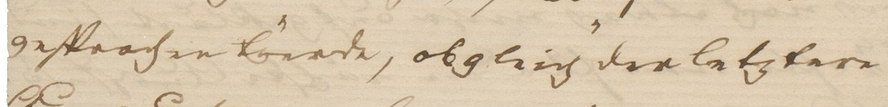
gesprochen werde, obgleich der letztere
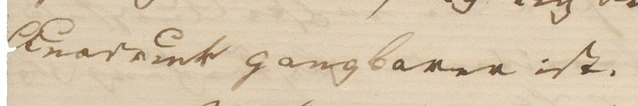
Ausdruck gangbarer ist.
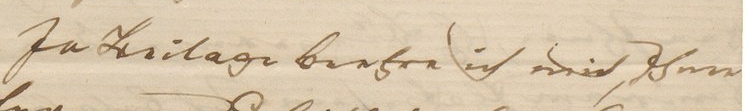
In Beilage beehre ich mich Ihnen
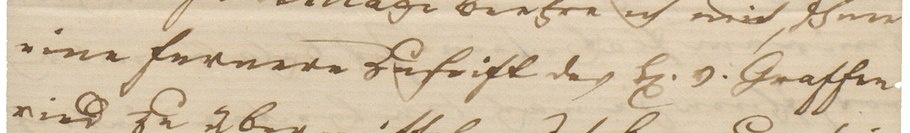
eine fernere Zuschrift des Hrn. v. Graffen-
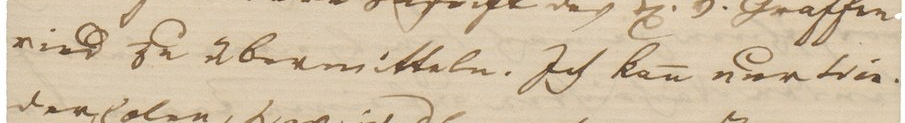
ried zu übermitteln. Ich kann nur wie-
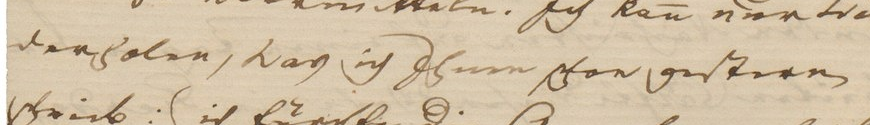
derholen, was ich Ihnen schon gestern
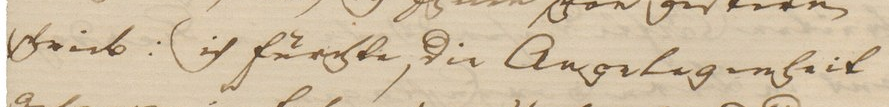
schrieb: ich fürchte, die Angelegenheit
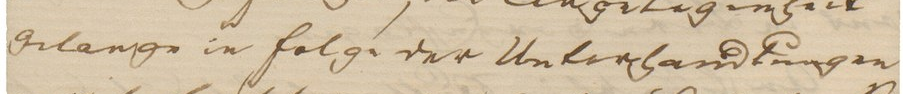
gelange in Folge der Unterhandlungen
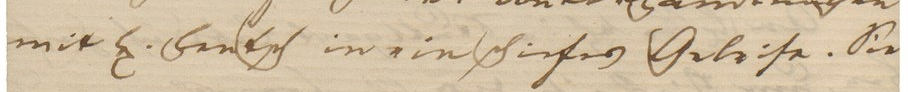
mit H. Hentschin ein schiefes Geleise. Sie
